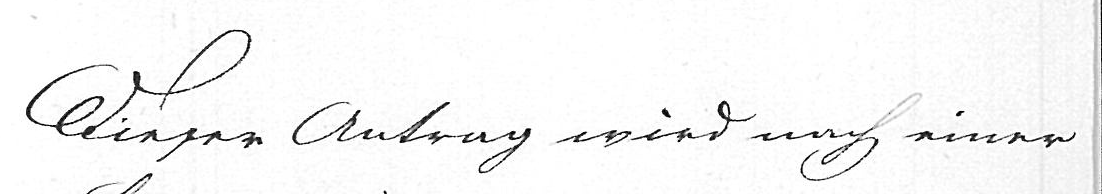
Dieser Antrag wird nach einer
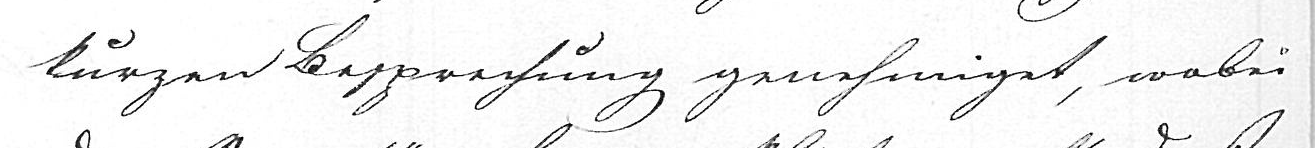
kurzen Besprechung genehmiget, wobei
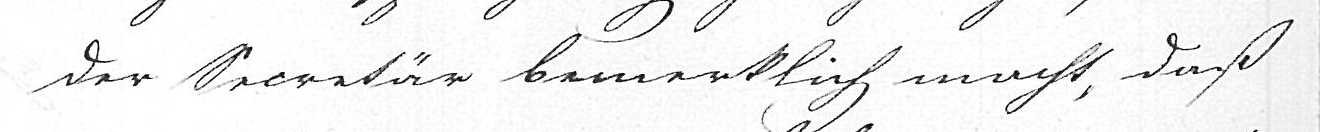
der Secretär bemerklich macht, daß
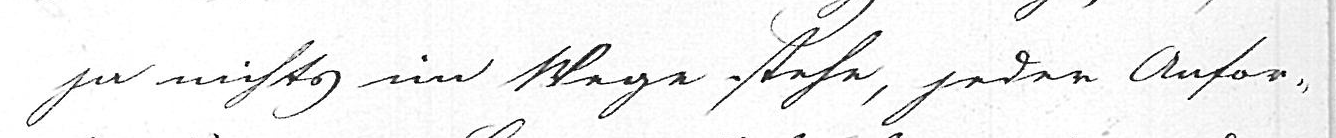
ja nichts in Wege stehe, jeder Anfor-
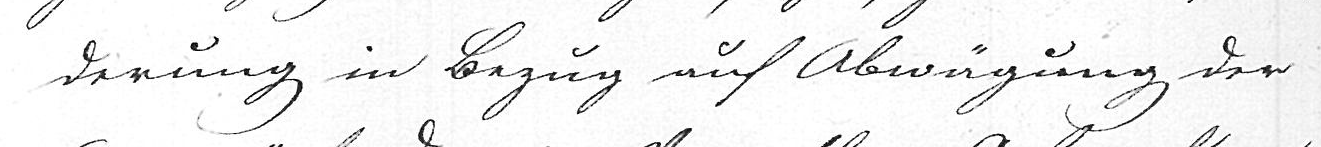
derung in Bezug auch Abwägung der
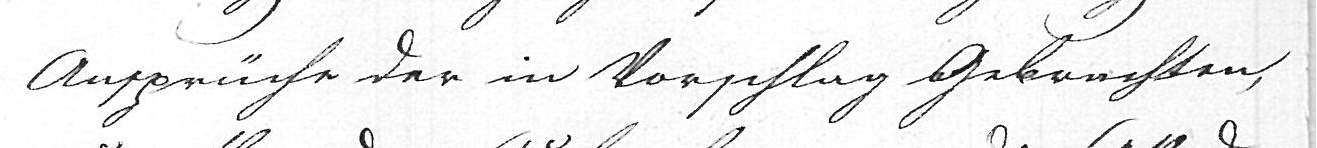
Ansprüche der in Vorschlag Gebrachten,
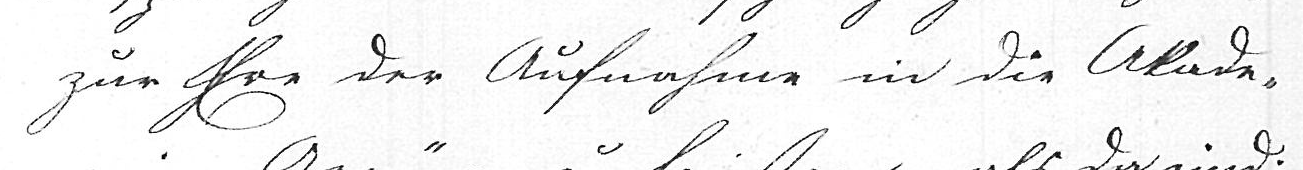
zur Ehre der Aufnahme in die Akade-
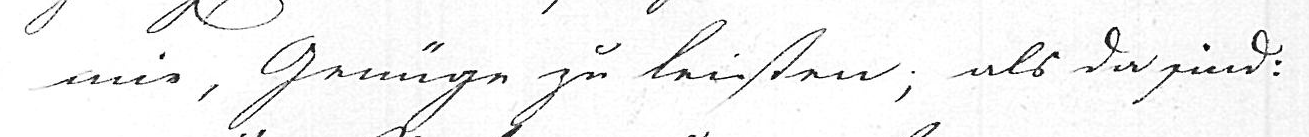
nur, Genüge zu leisten, als da sind
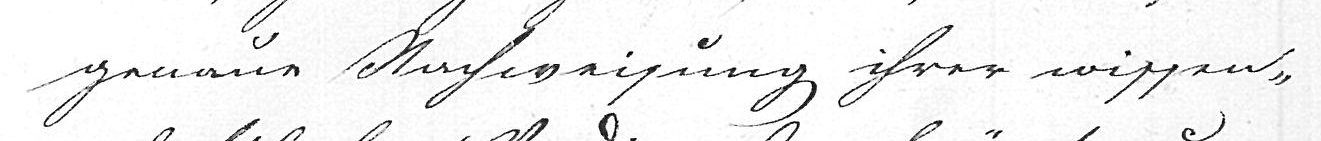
genaue Nachweisung ihrer wissen-
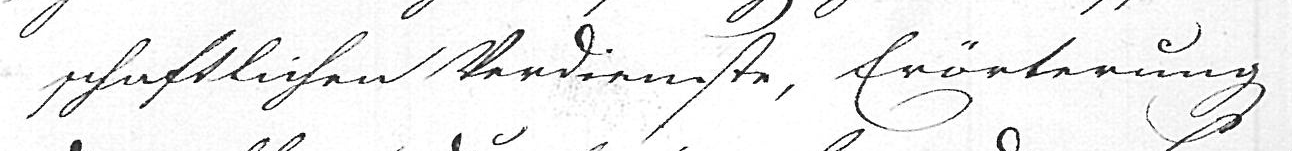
schaftlichen Verdienste, Erörterung
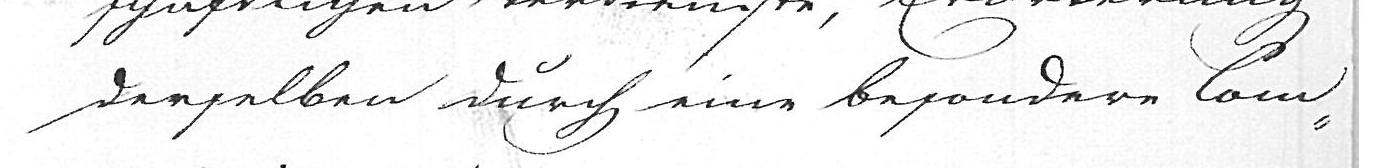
derselben durch eine besondere Com-
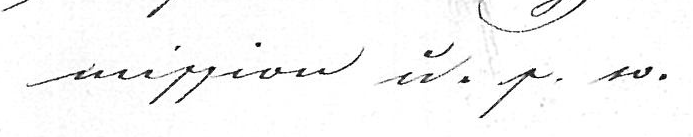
mission u. s. w.
